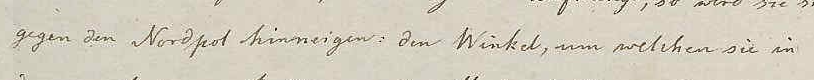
gegen den Nordpol hinneigen: den Winkel, um welchen sie in
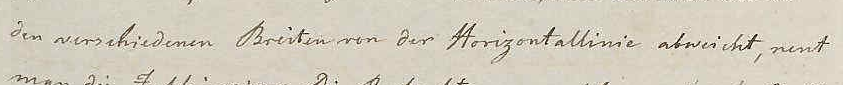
den verschiedenen Breiten von der Horizontallinie abweicht, nent
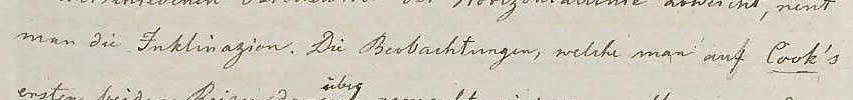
man die Inklinazion. Die Beobachtungen, welche man auf Cook's
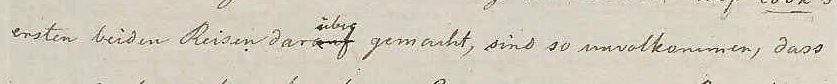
ersten beiden Reisen daraufüber gemacht, sind so unvolkommen, dass
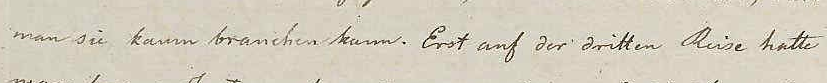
man sie kaum brauchen kann. Erst auf der dritten Reise hatte
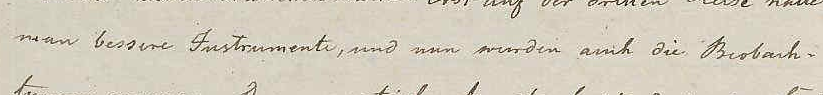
man bessere Instrumente, und nun wurden auch die Beobach-
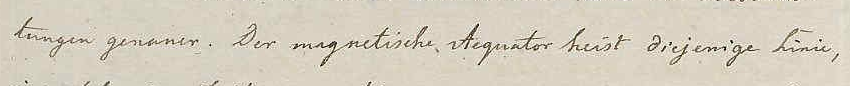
tungen genauer. Der magnetische Aequator heist diejenige Linie,
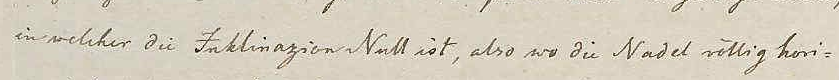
in welcher die Inklinazion Null ist, also wo die Nadel völlig hori-
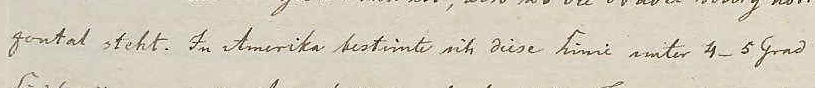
zontal steht. In Amerika bestimte ich diese Linie unter 4–5 Grad
